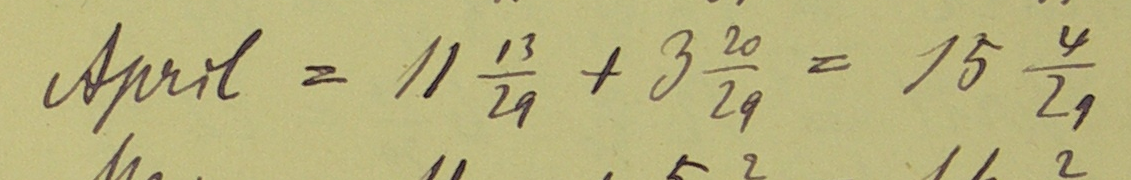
April = 11 13/29 + 3 20/29 = 15 4/29
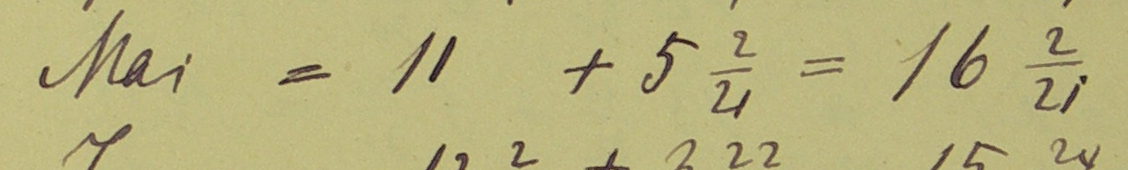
Mai = 11 + 5 2/21 = 16 2/21
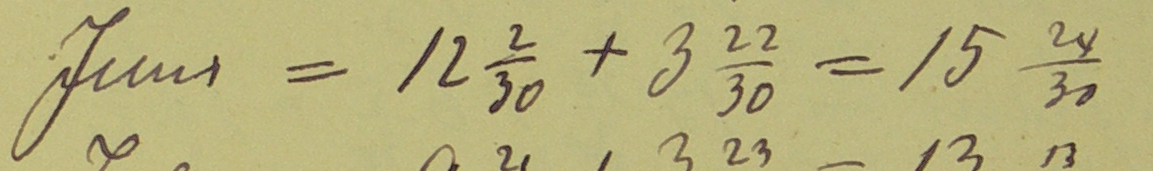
Juni = 12 2/30 + 3 22/30 = 15 24/30
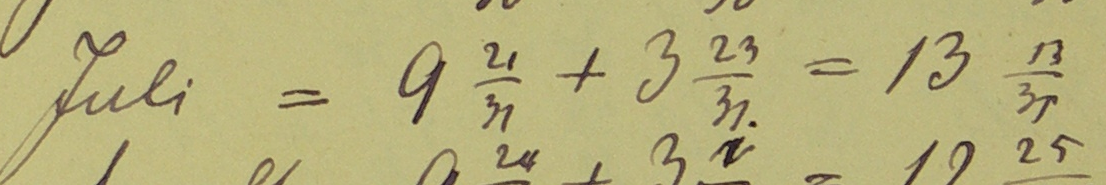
Juli = 9 21/31 + 3 23/31 = 13 13/31
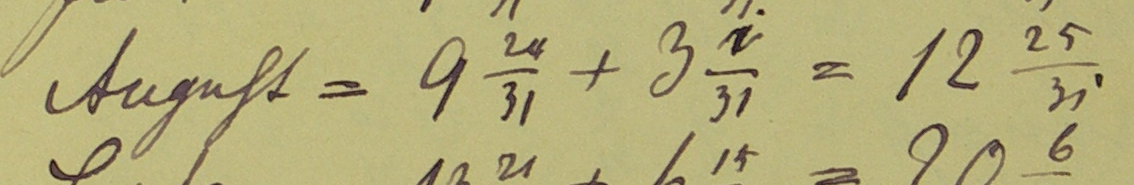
August = 9 24/31 + 3 1/31 = 12 25/31
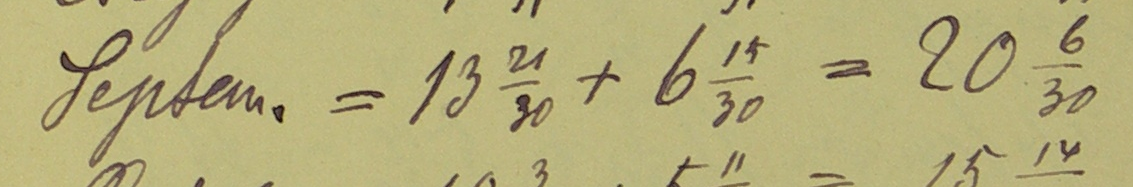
Septem. = 13 21/30 + 6 15/30 = 20 6/30
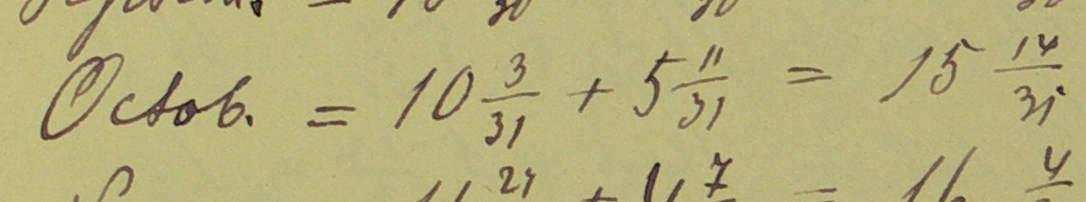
Octob. = 10 3/31 + 5 11/31 = 15 14/31
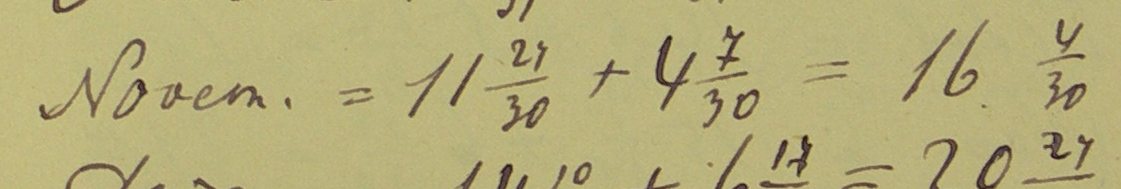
Novem. = 11 27/30 + 4 7/30 = 16 4/30
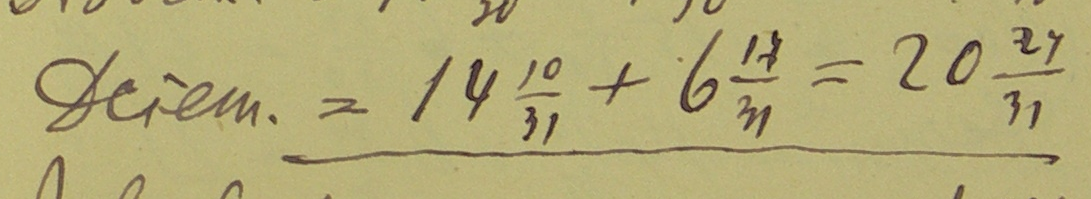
Decem. = 14 10/31 + 6 17/31 = 20 27/31
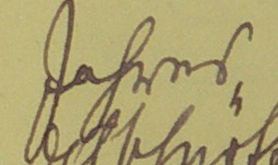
Jahres-
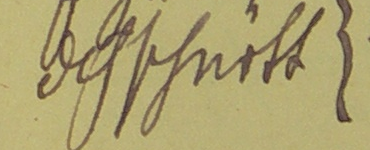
Durchschnitt
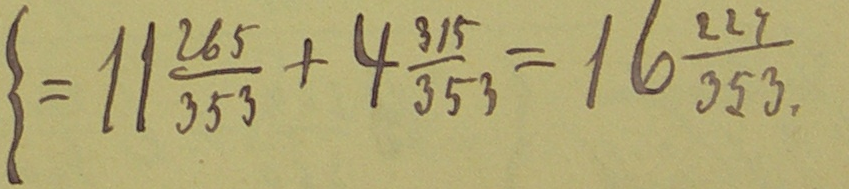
= 11 265/353 + 4 315/353 = 16 227/353
